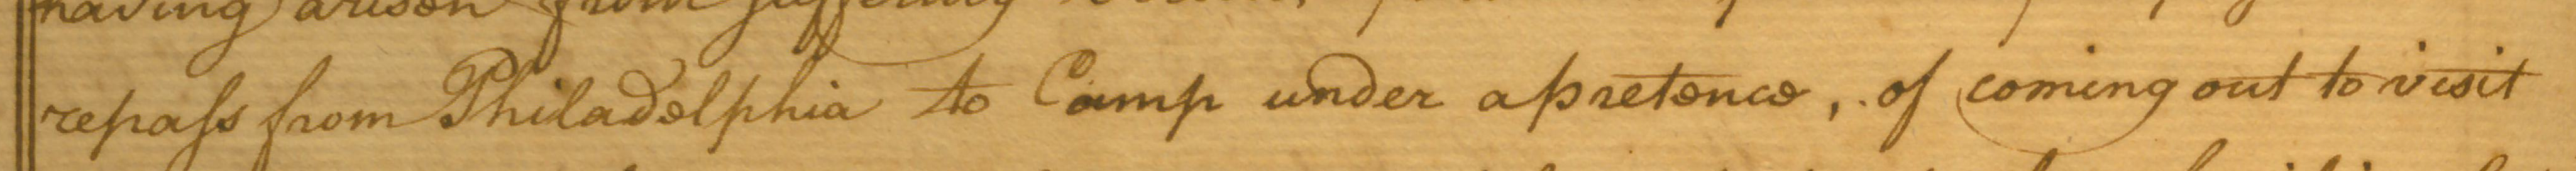repass from Philadelphia to Camp under a pretence, of coming out to visit
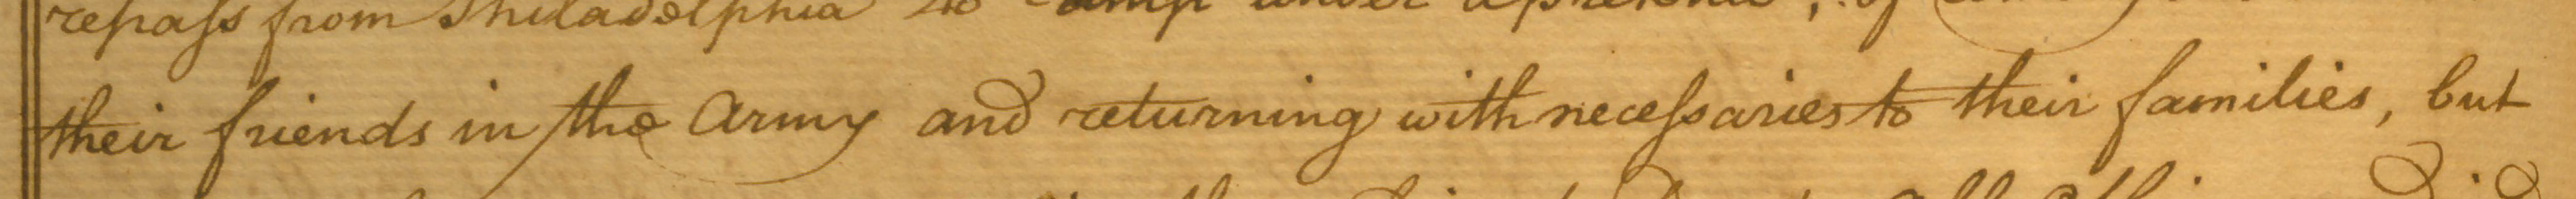their friends in the army and returning with necessaries to their families, but
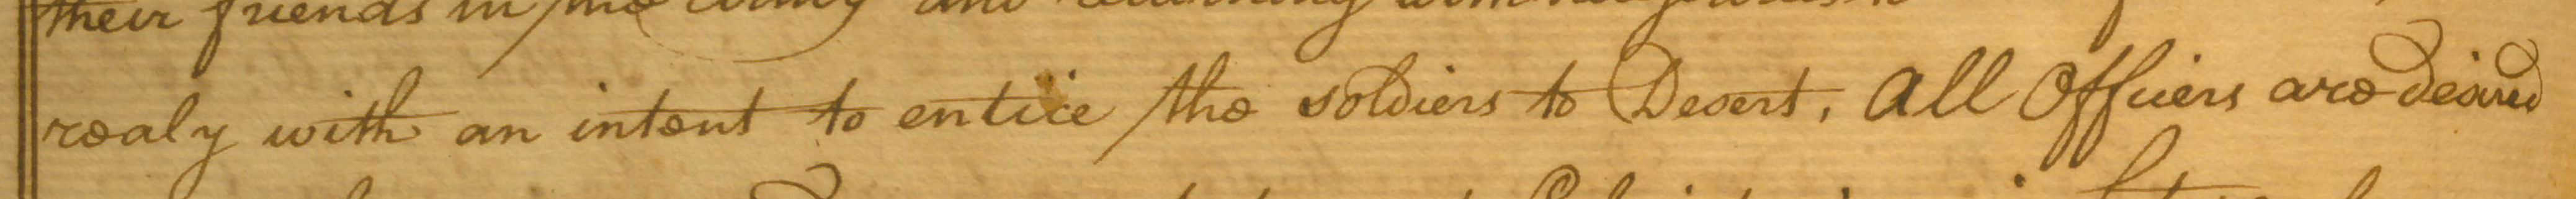realy with an intent to entice the soldiers to Desert. All Officers are desired
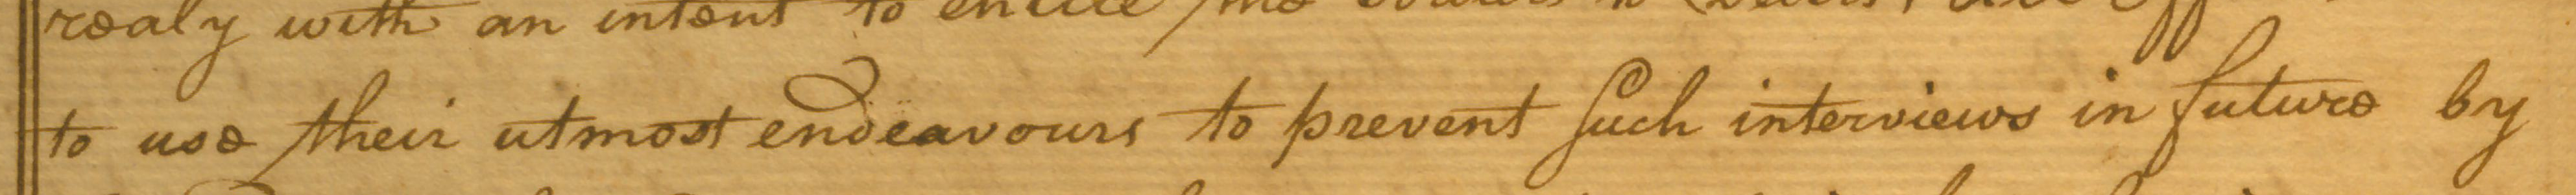to use their utmost endeavours to prevent such interviews in future by
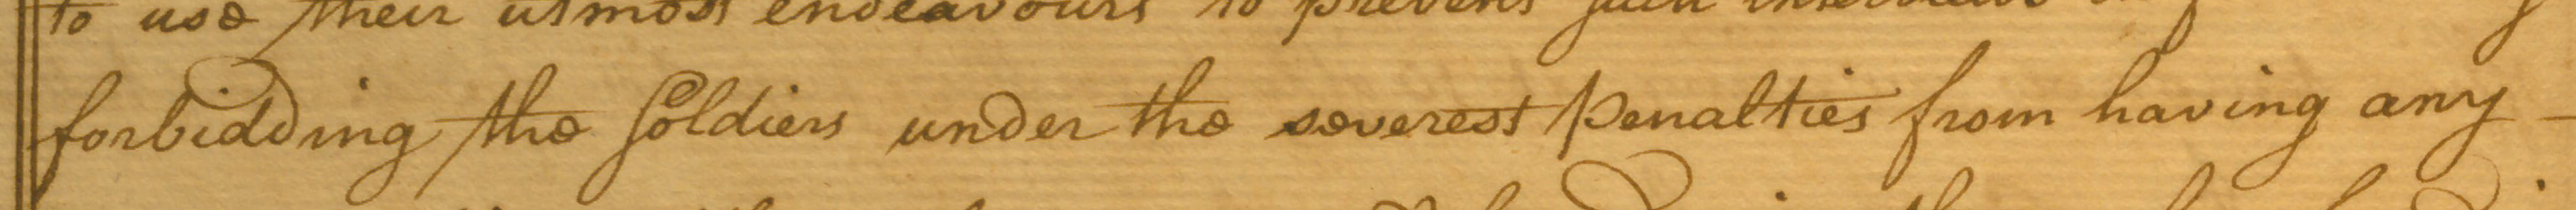forbidding the soldiers under the severest penalties from having any
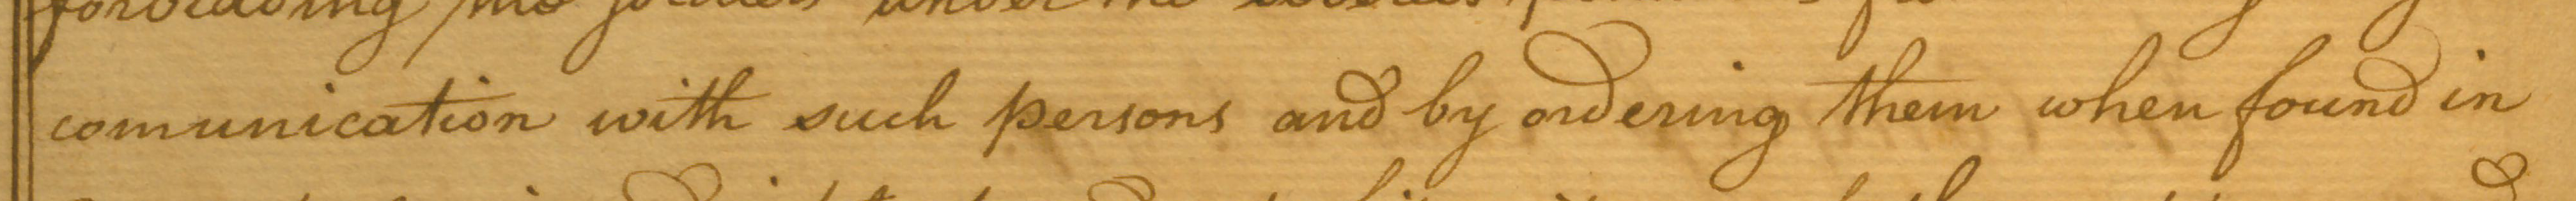communication with such persons and by ordering them when found in
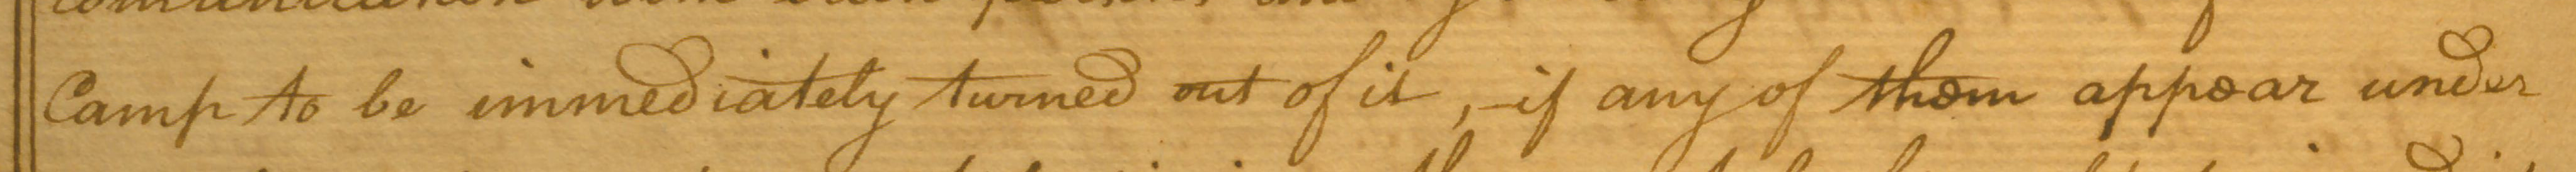Camp to be immediately turned out of it, if any of them appear under
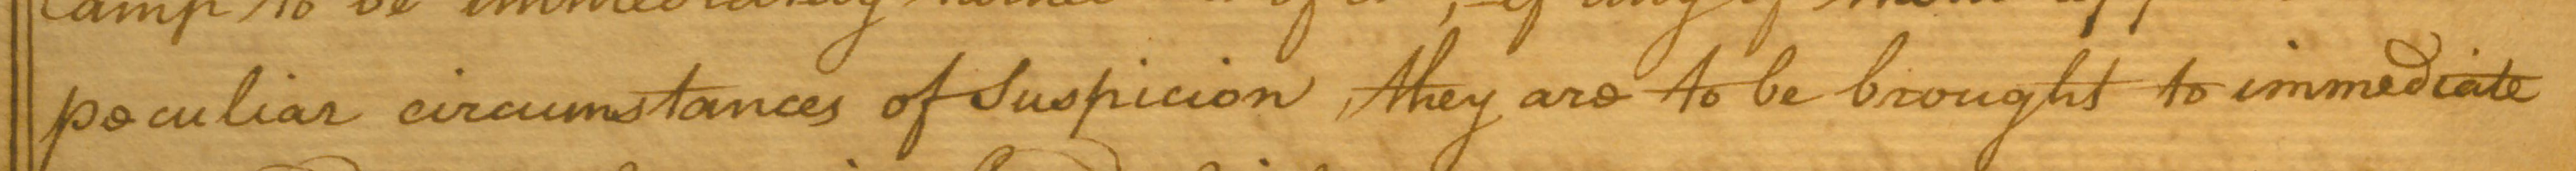peculiar circumstances of Suspicion, they are to be brought to immediate
